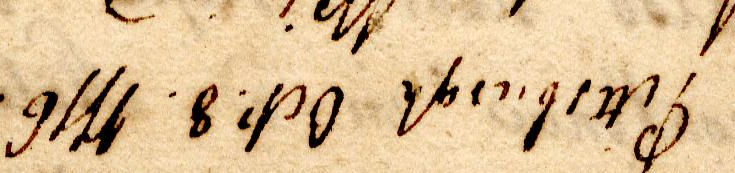Pittsburgh Oct^r. 8. 1776.
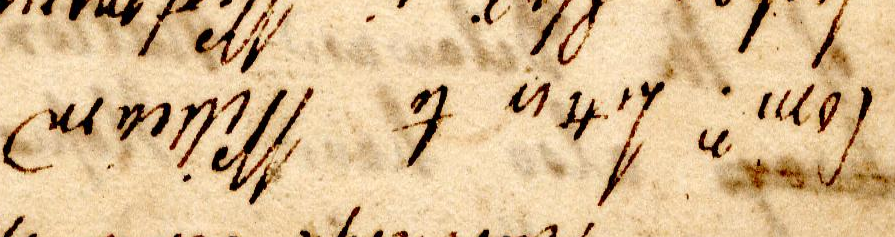Com^r. Letter to William
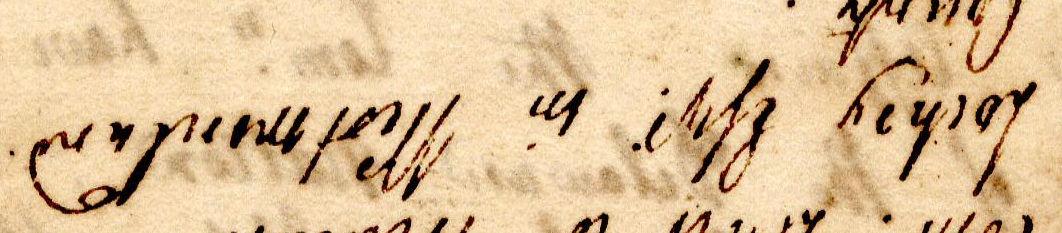Lochry Esq^r. in Westmoreland
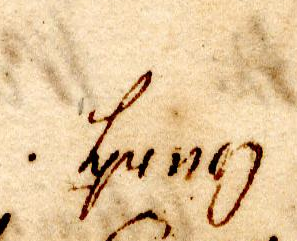County.
